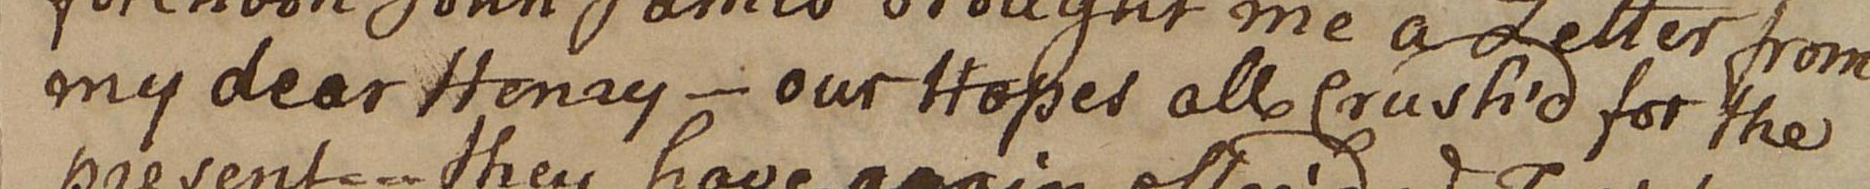my dear Henry- our Hopes all Crush'd for the
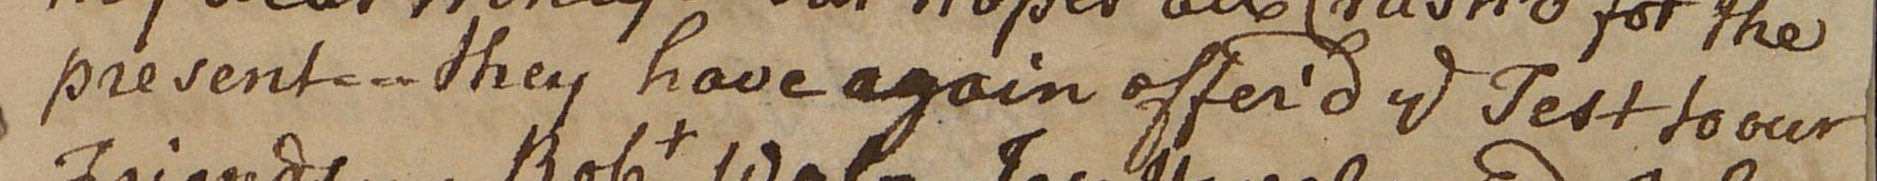present- they have again offer'd y^e Test to our
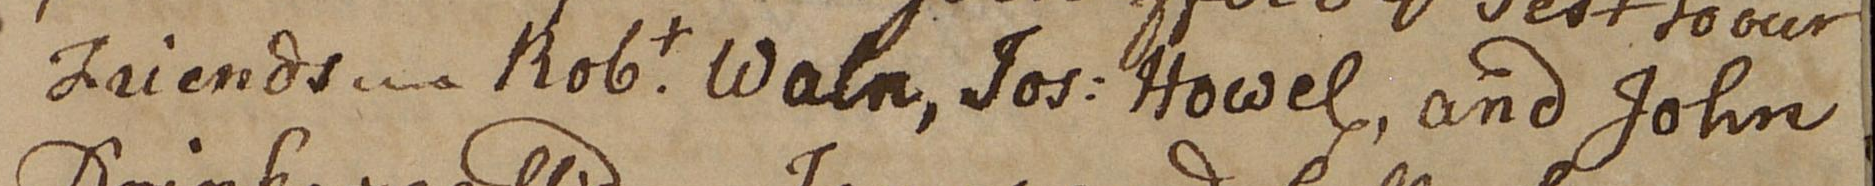Friends- Rob^t. Waln, Jos: Howel, and John
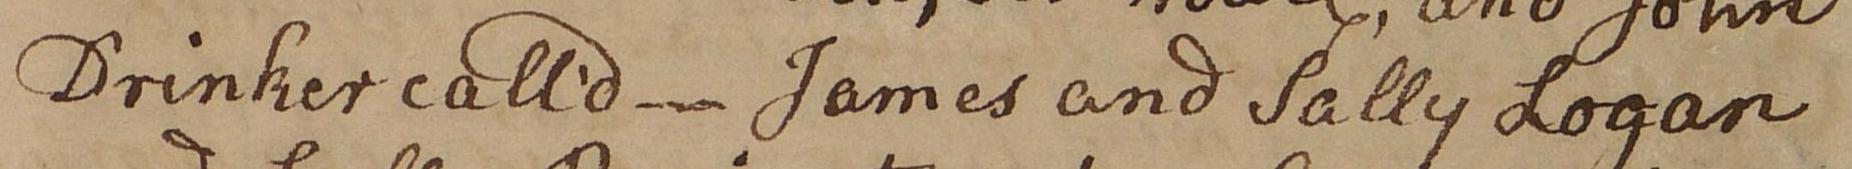Drinker call'd- James and Sally Logan
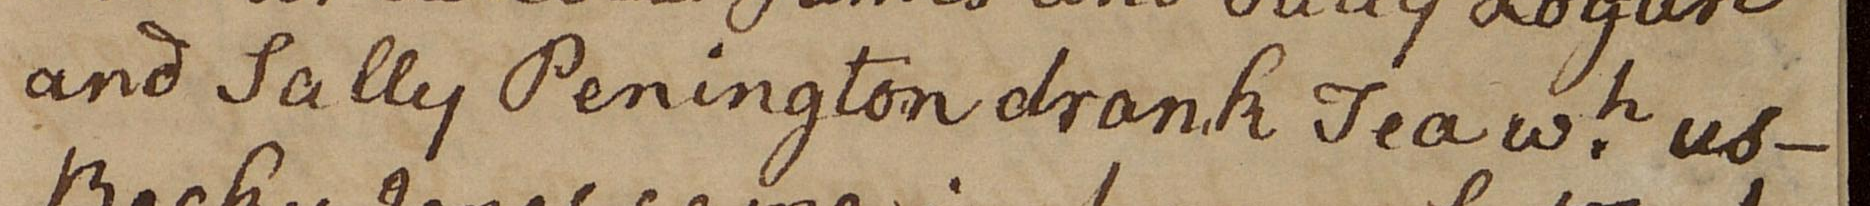and Sally Penington drank Tea w^h. us-
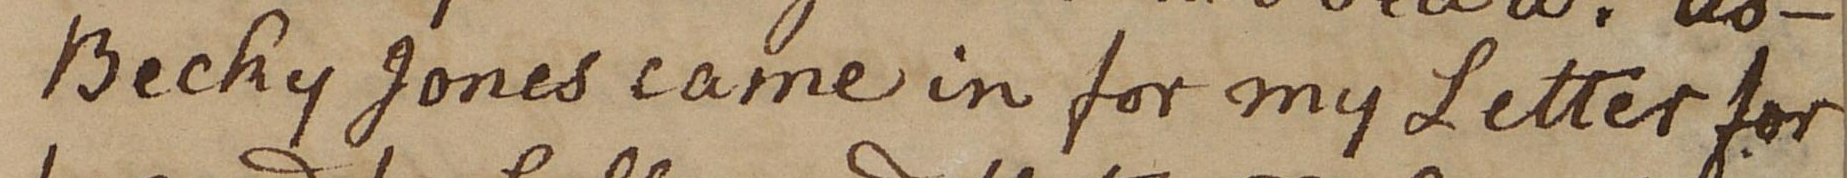Becky Jones came in for my Letter for
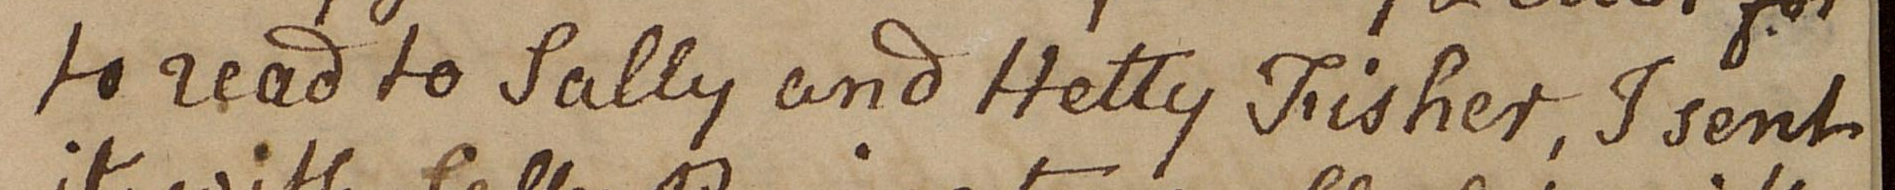to read to Sally and Hetty Fisher, I sent
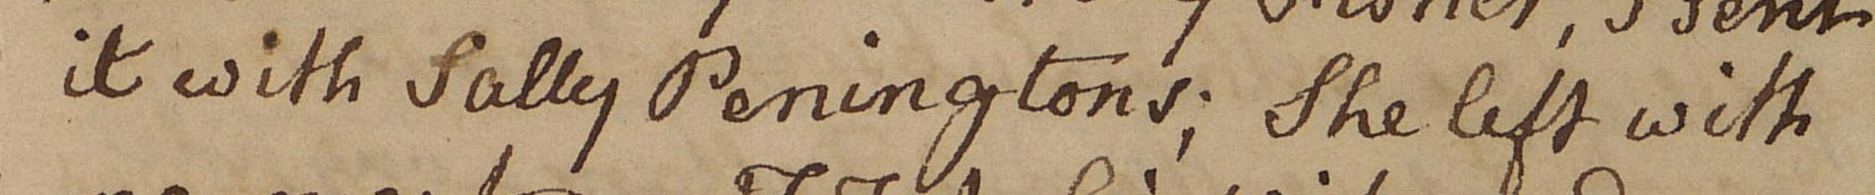it with Sally Peningtons; She left with
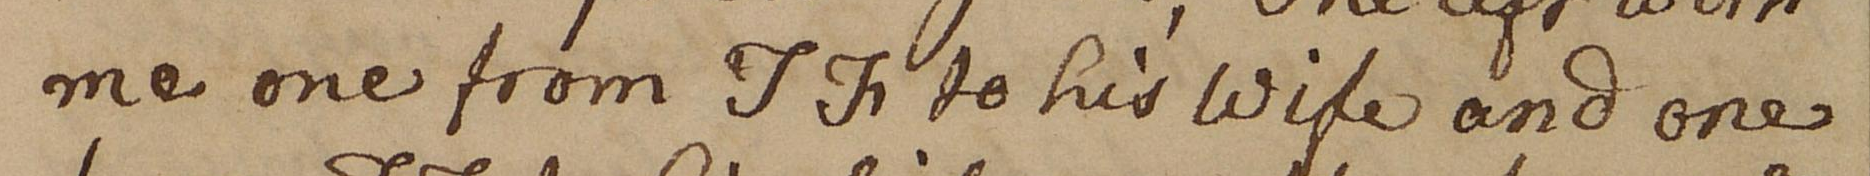me one from TF to his wife and one
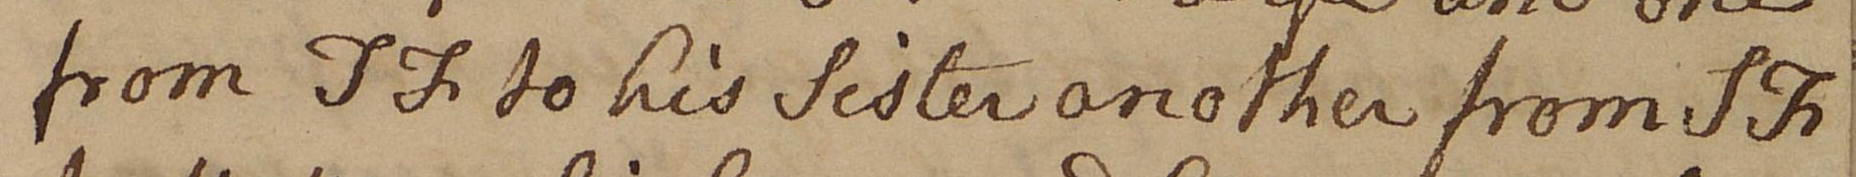from TF to his Sister another from SF
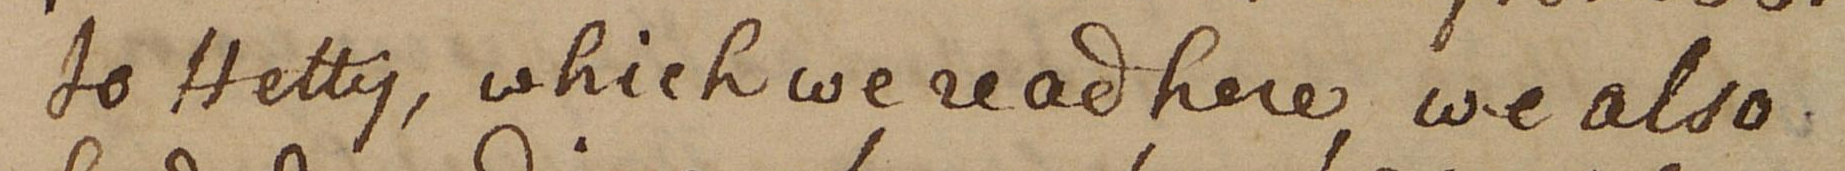to Hetty, which we read here, we also
